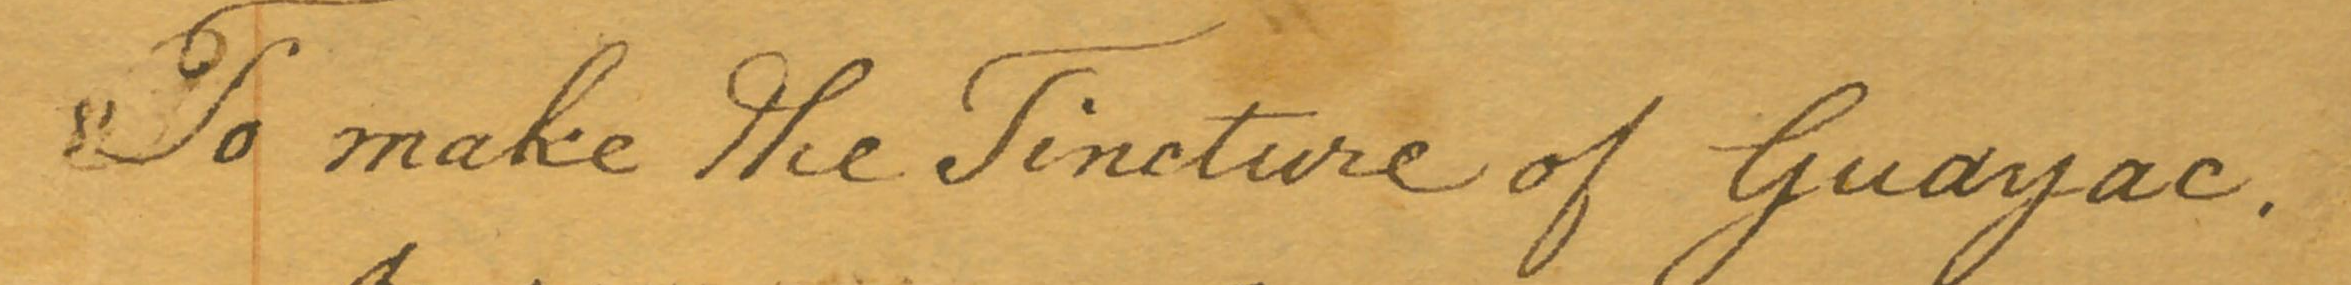To make the Tincture of Gudyac.
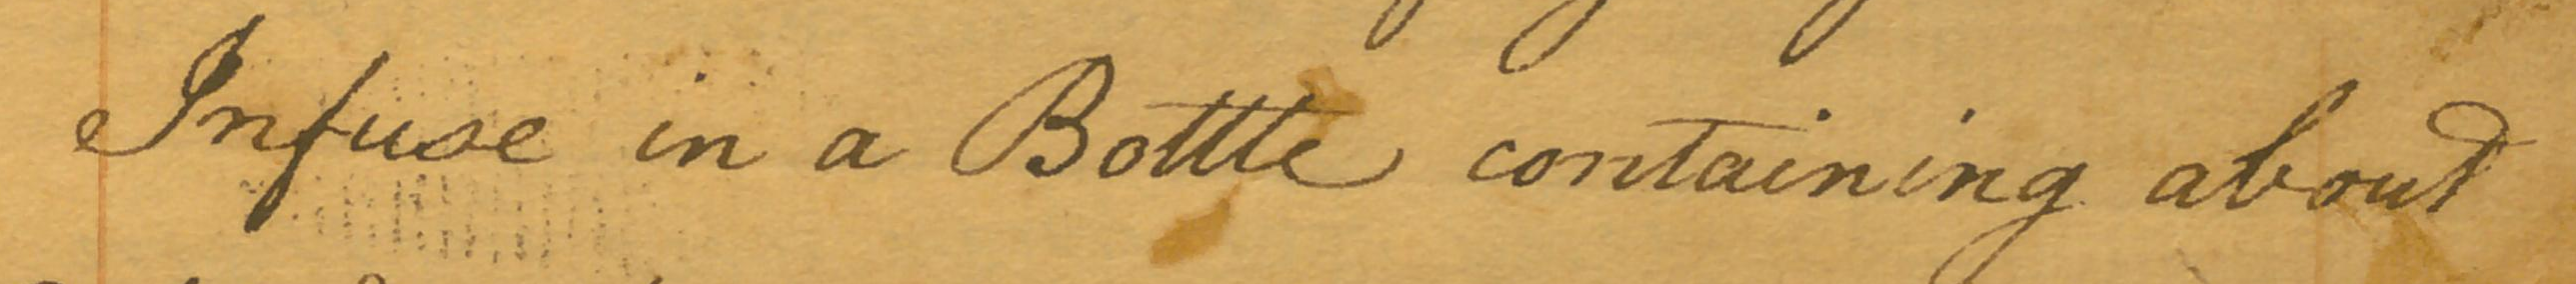Infuse in a Bottle containing about
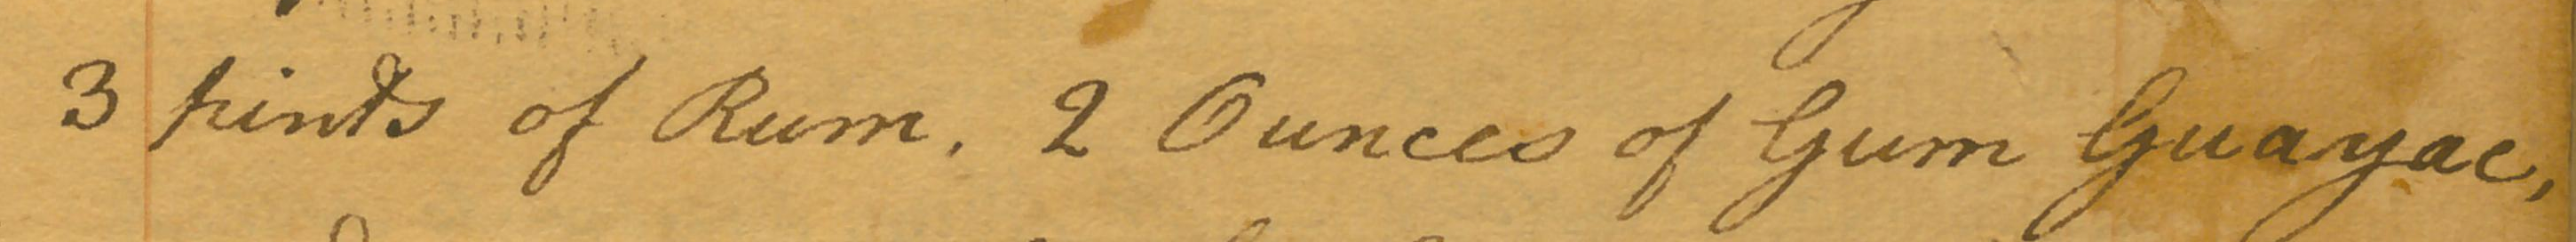3 pints of Rum, 2 Ounces of Gum Guayac,
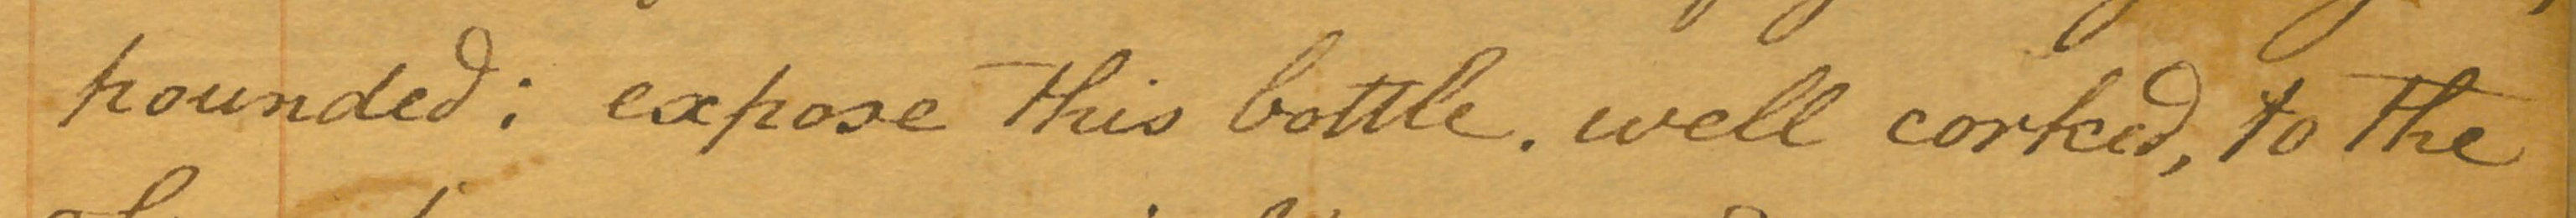pounded; expose this bottle, well corked, to the
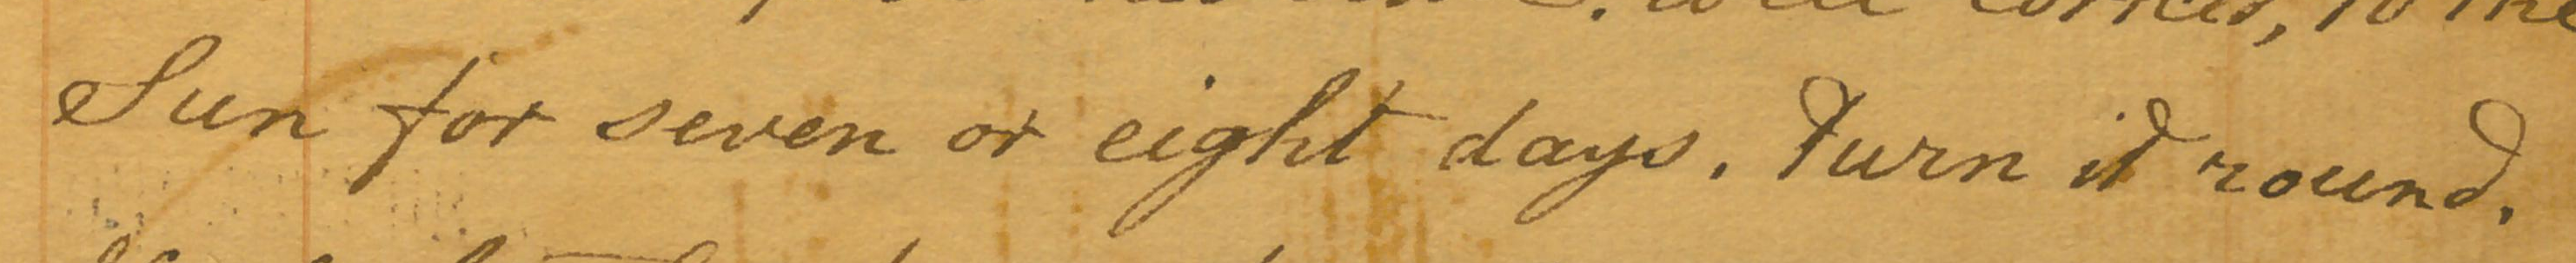sun for seven or eight days, turn it round,
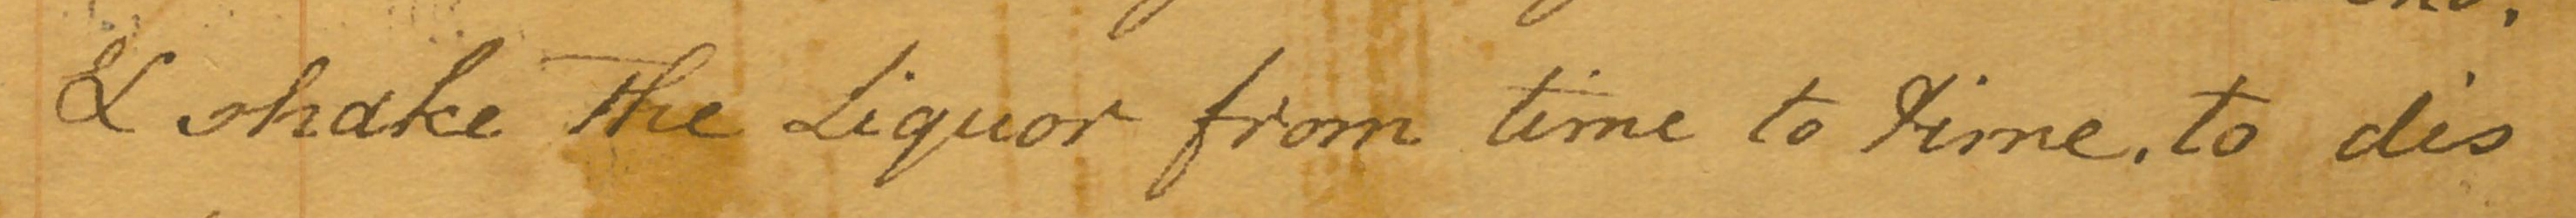& shake the Liquor from time to time, to dis
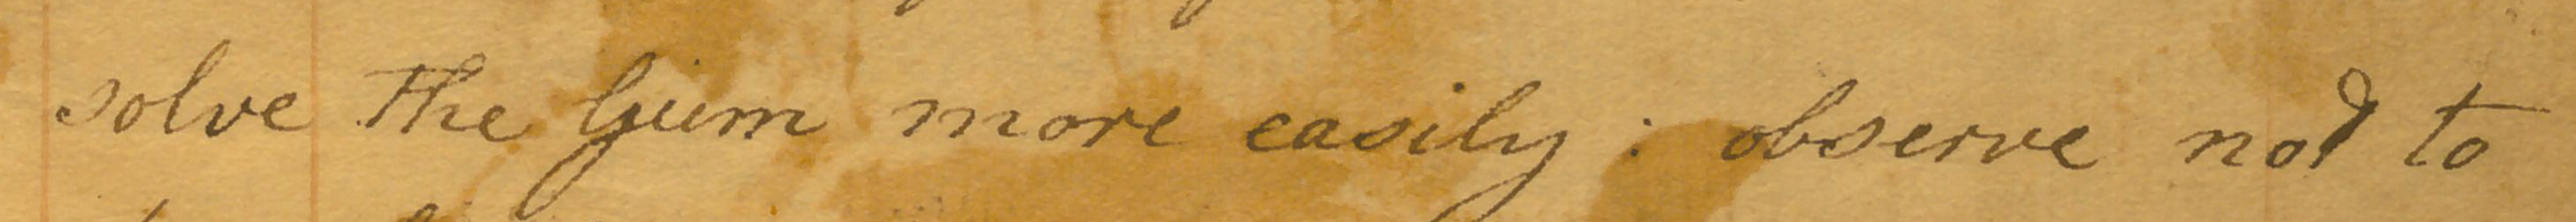solve the Gum more easily; observe not to
